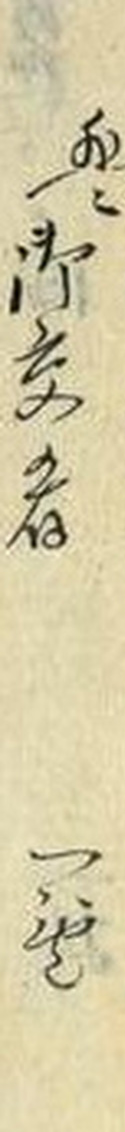御交肴一台
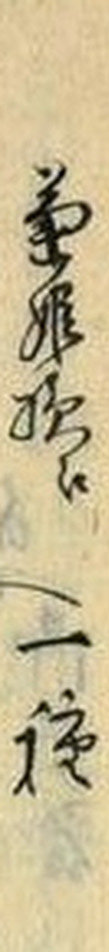菊姫様江一種
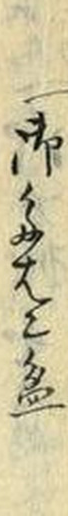御たはこ盆
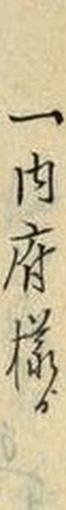一内府様ゟ
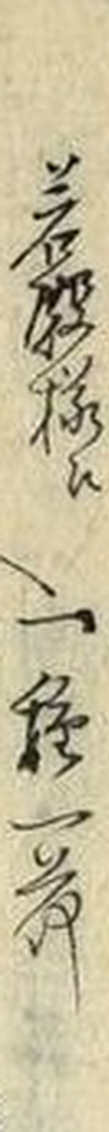若殿様江一種一荷
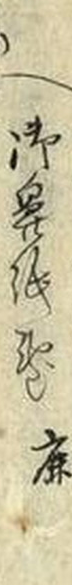御鼻紙台廉
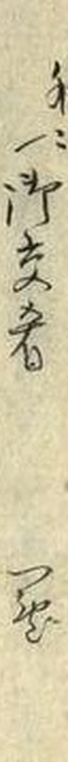御交肴一台
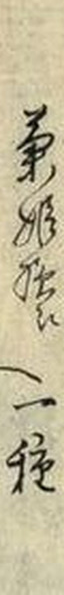菊姫様江一種
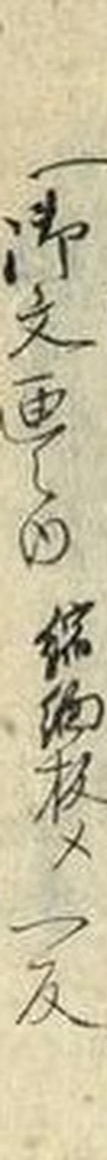御文匣之内縮緬板〆一反
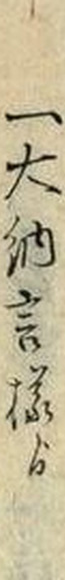一大納言様ゟ
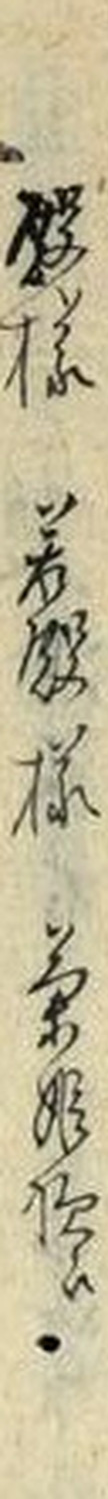殿様若殿様菊姫様江
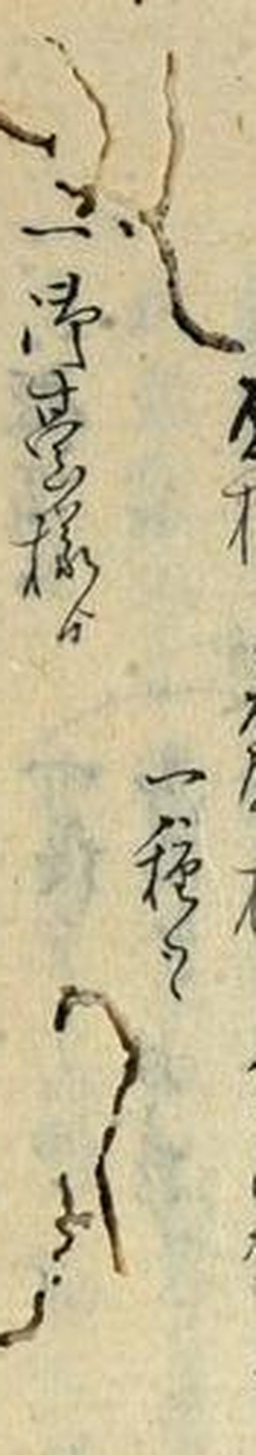一御台様ゟ
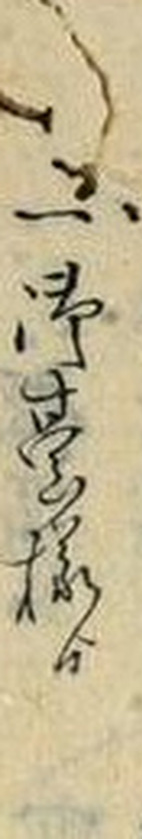一御台様ゟ

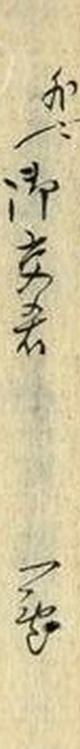外ニ御交肴一台
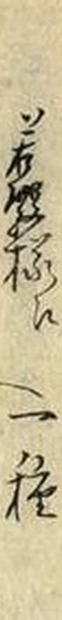若殿様江一種
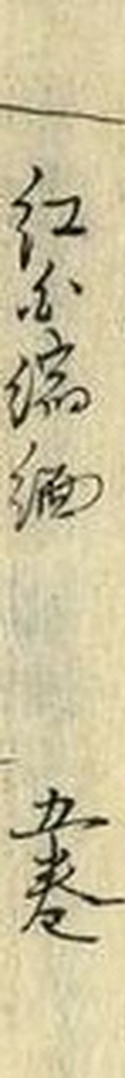紅白縮緬五巻
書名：少傅日録抄（斉承付側向頭取日記、在府）
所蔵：福井県文書館 Fukui Prefectural Archives
